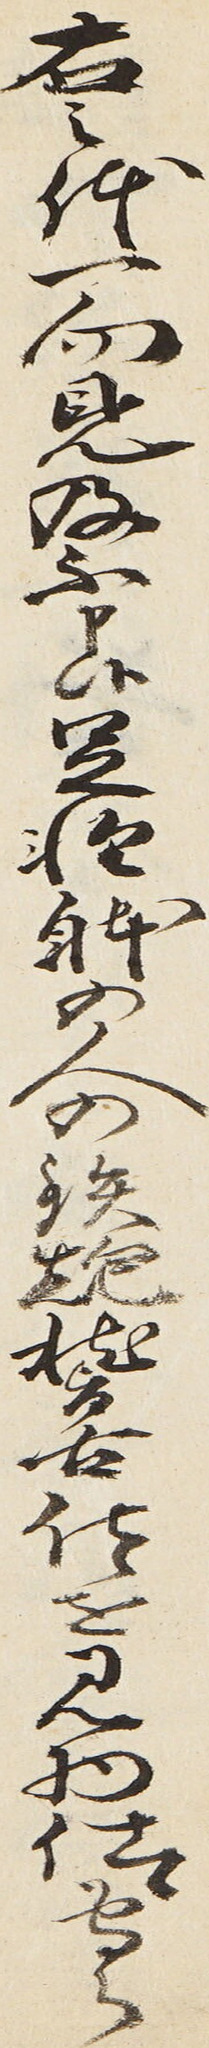右之体一向見及不申候足軽躰の人の鉄炮稽古仕候を見物仕候専ら
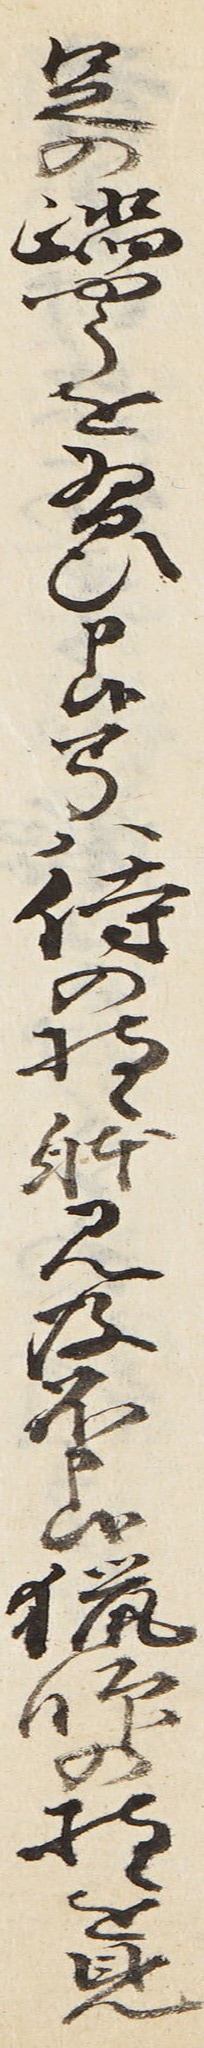足の踏やうを習ひ申候弓は侍の持候躰見及不申候猟師の持候を見
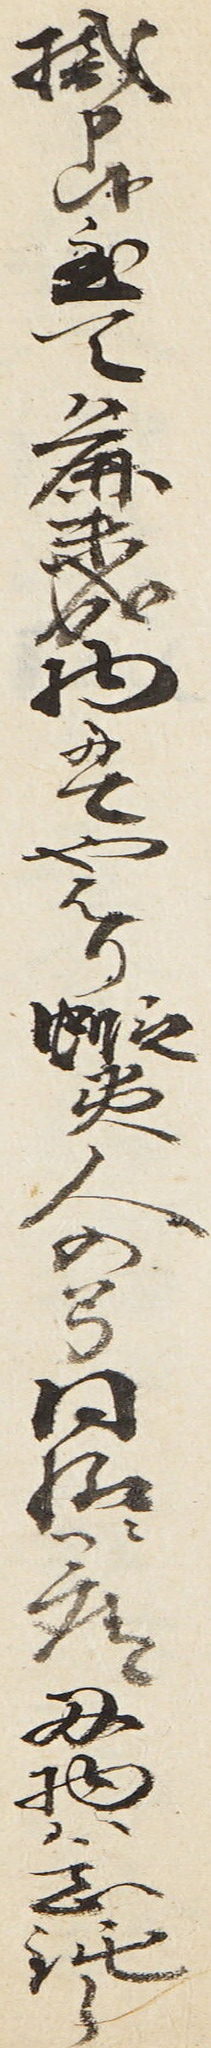掛申候至て麁末成物にてやはり蝦夷人の弓同様に御座候刃物は甚鈍し
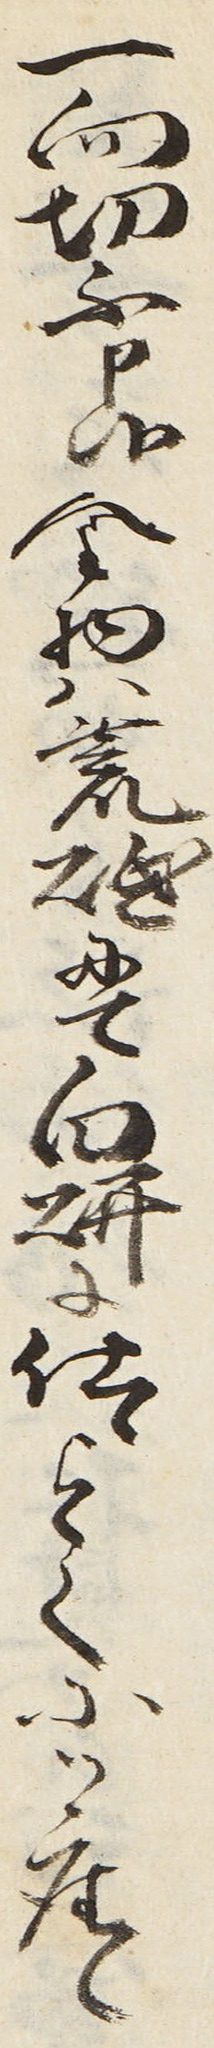一向切不申候金物は荒砥にて白研に仕候ことくに御座候
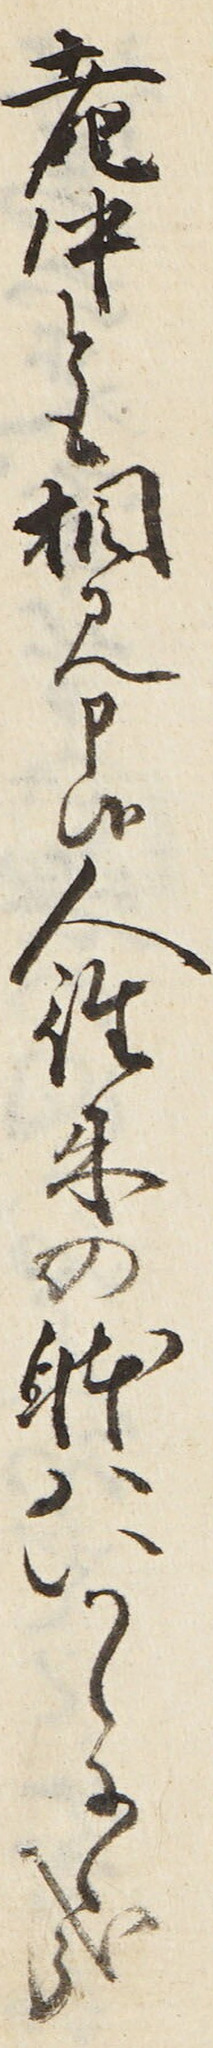老中とも相見申候人往来の躰はいかゝに候哉

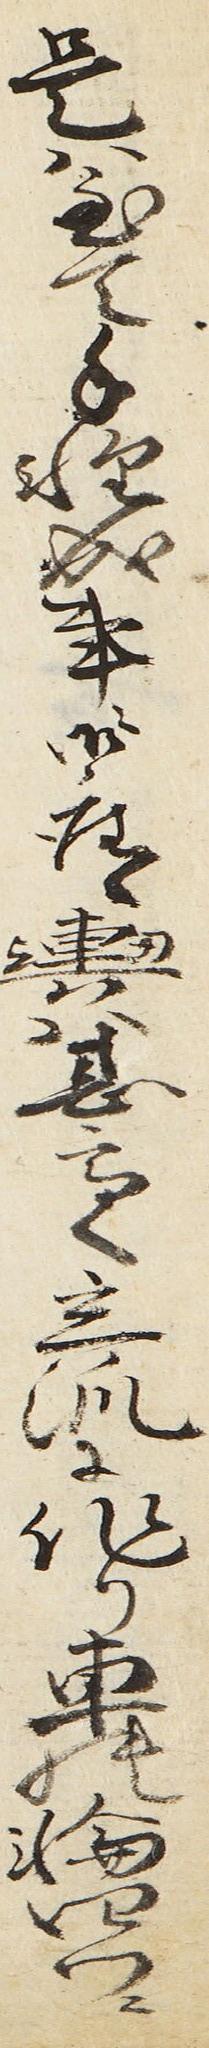是は至て手軽成事に御座候輿は甚高く立派に作り車の輪四つに
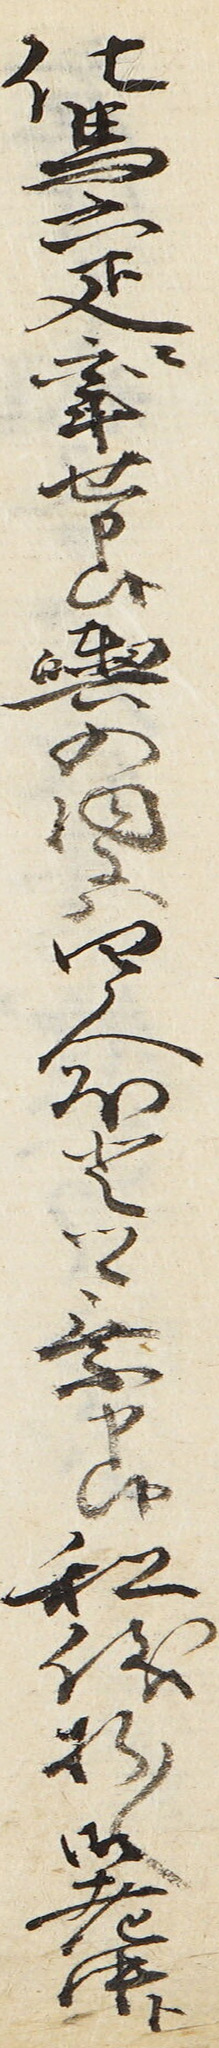仕馬六疋に牽せ申候輿の内には四人ほとつゝ乗申候私儀折々御老中と
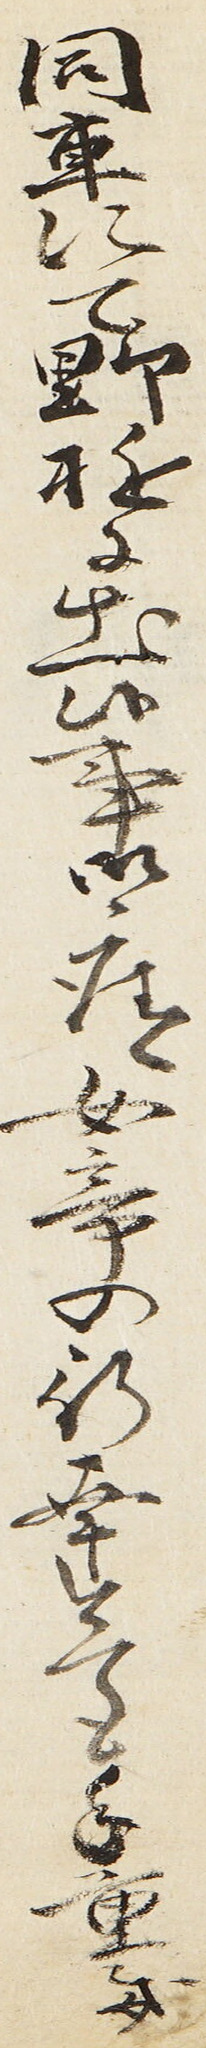同車にて野遊に出候事御座候女帝の行幸とても手重き
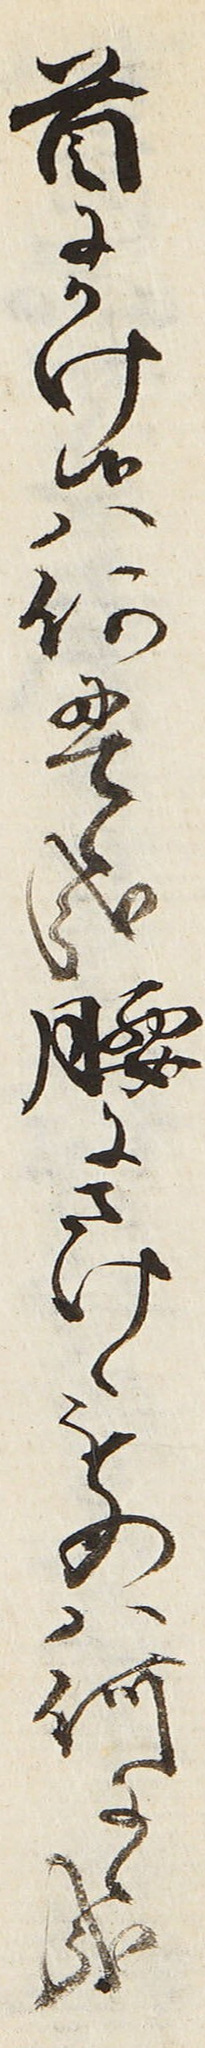首にかけ候は何にて候哉腰にさけしものは何に候哉
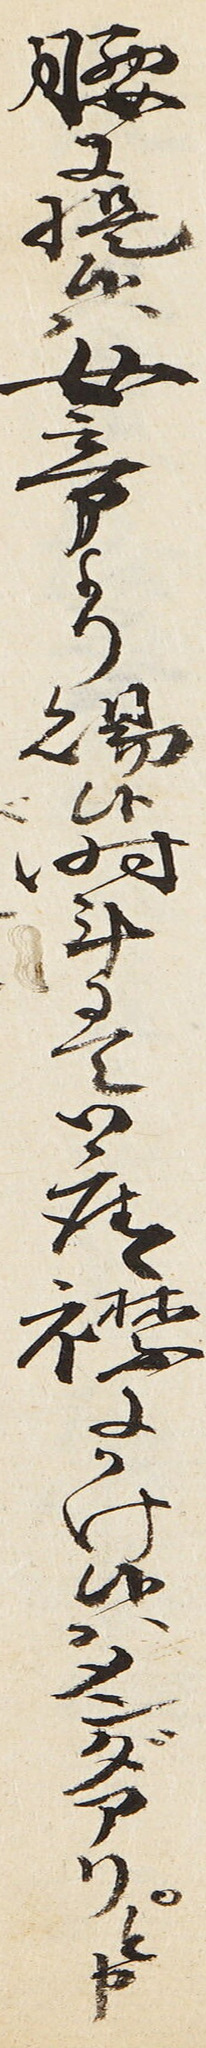腰に提候は女帝より賜候時計にて御座候襟にかけ候はメンダアリ。と申
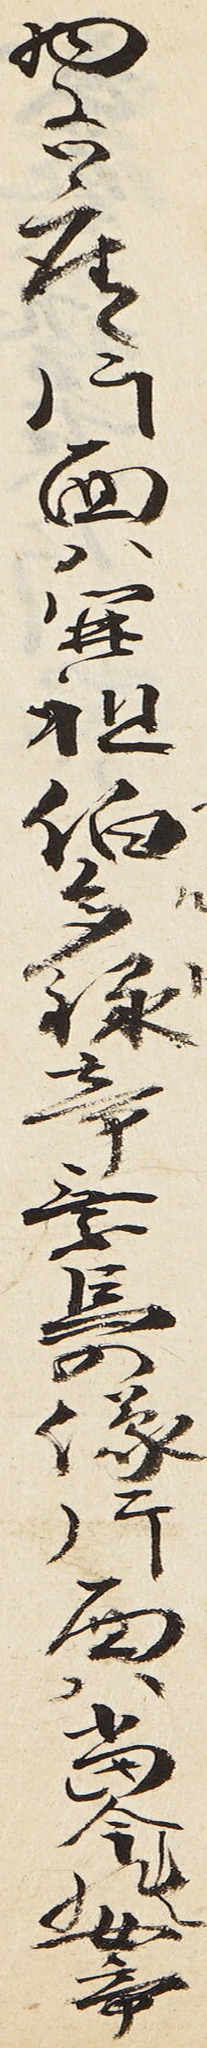物に御座候片面は開祖伯多録帝乗馬の像片面は当今の女帝
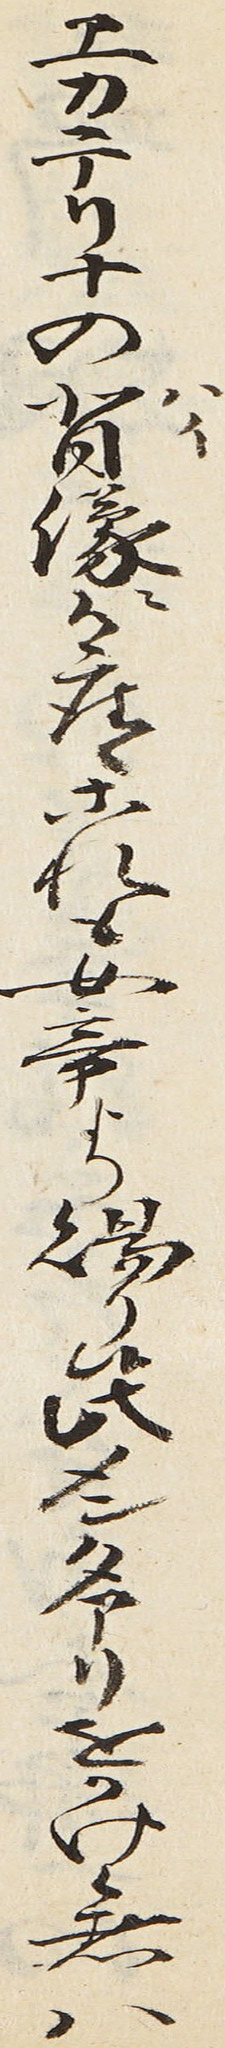ヱカテリナの背像に御座候これも女帝より賜り候此メンタアリをかけ候者は
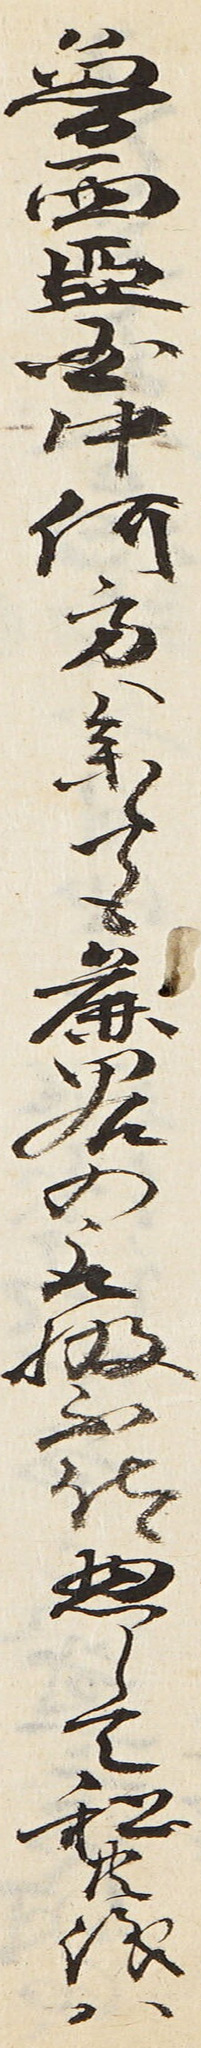魯西亜国中何方へ参候ても麁略の取扱不仕候惣して私共儀は
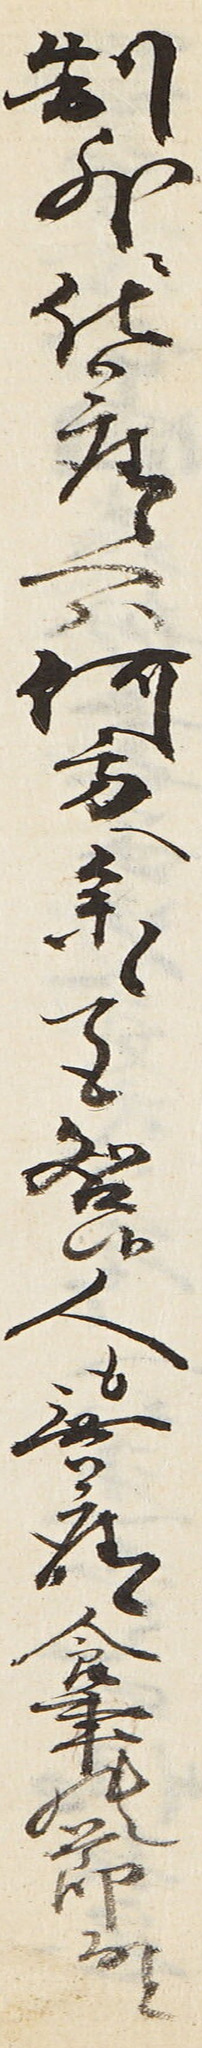制外に仕御座候へは何方へ参候ても咎候人も無御座候食事の節なと
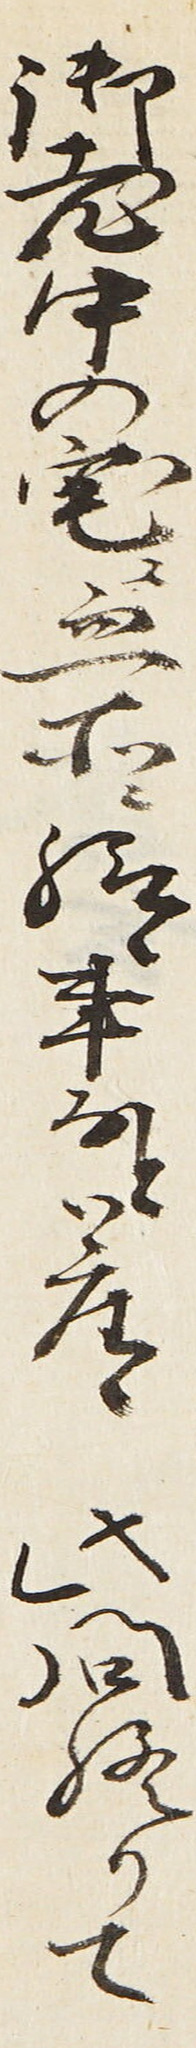御老中の宅に向一所に給候事なと御座候此問終りて
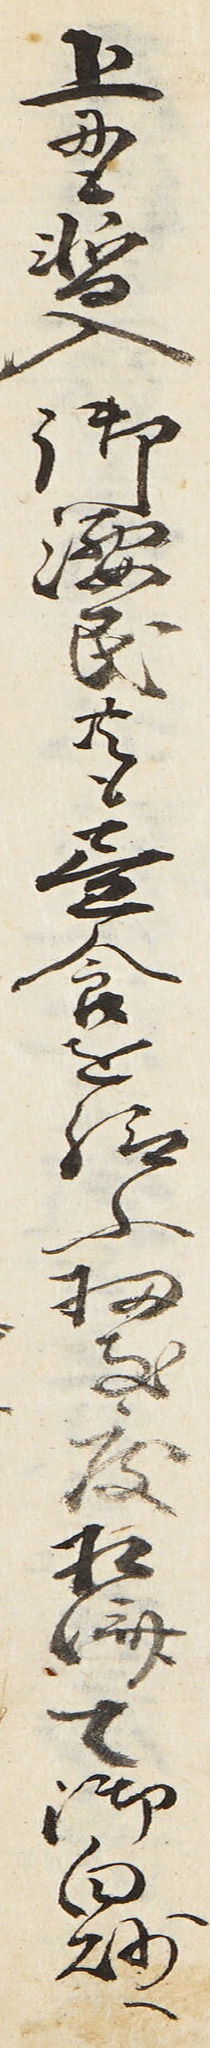上にも暫入御漂民共も昼食を給ふ扨支度相済て御白砂へ
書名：漂民御覧之記
